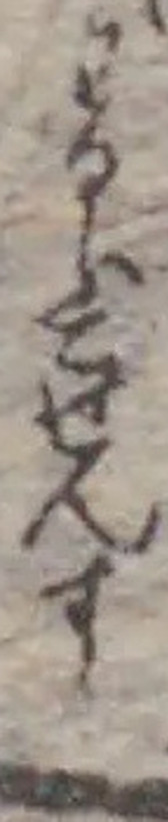わるふこせんす
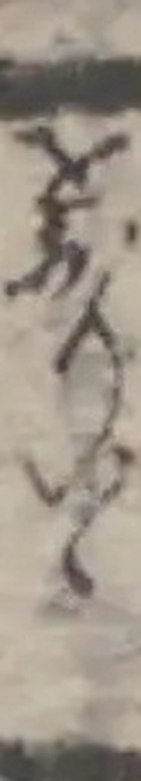をおりつゝ
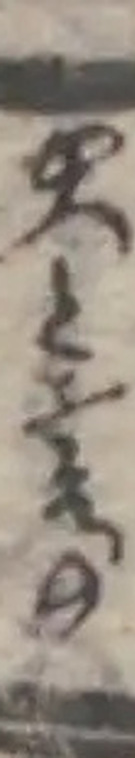やつと其事
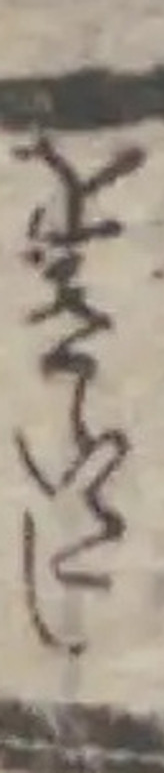をきゝいたし
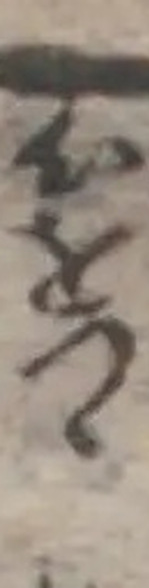心をつく
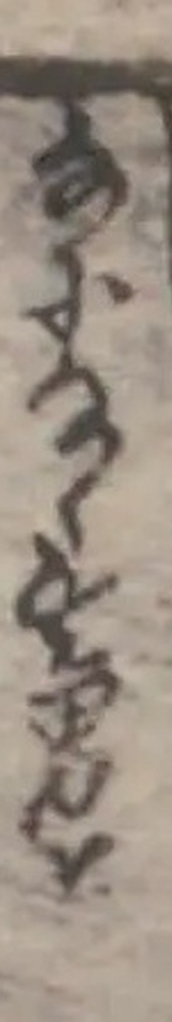なになく其男を
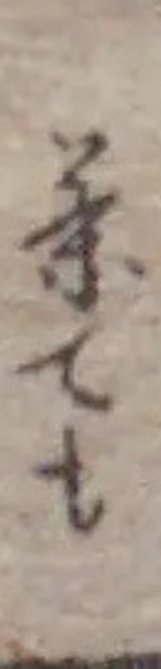茶ても
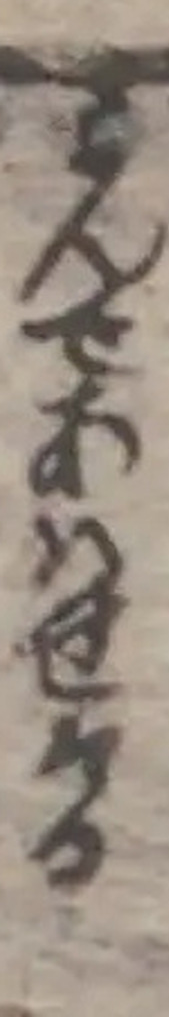よんであはせける
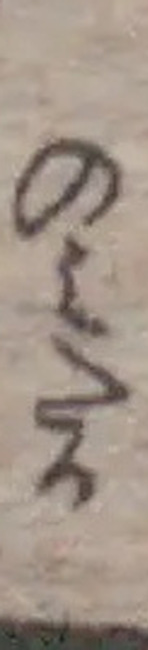のみたか
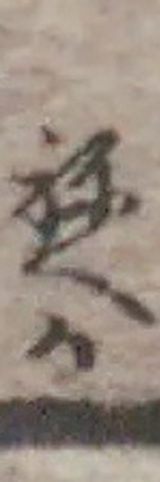ねへか
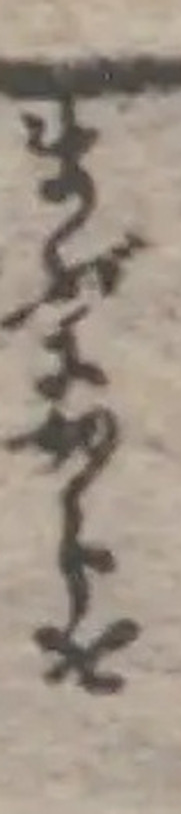まぶに女郎を
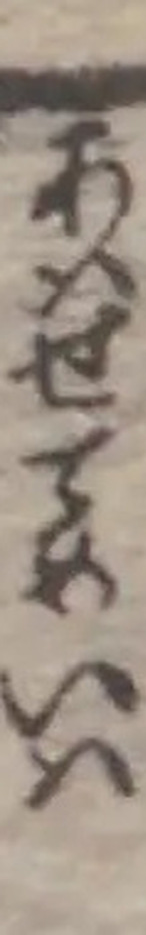あはせてめいは
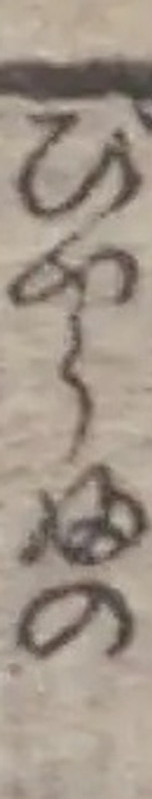びやうふの
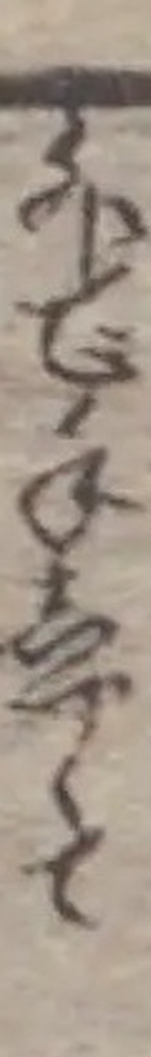外で手しやくて
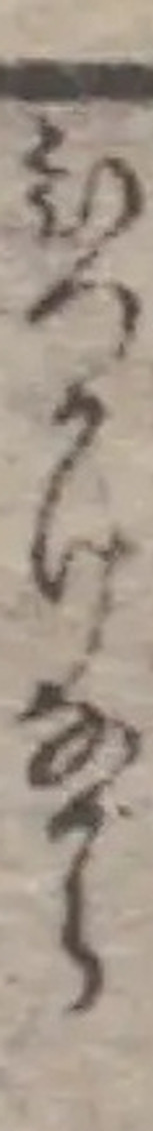ひつかけながら
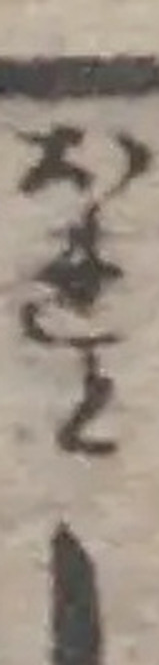おれと
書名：早出来 3巻
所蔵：国立国会図書館 National Diet Library, JAPAN
